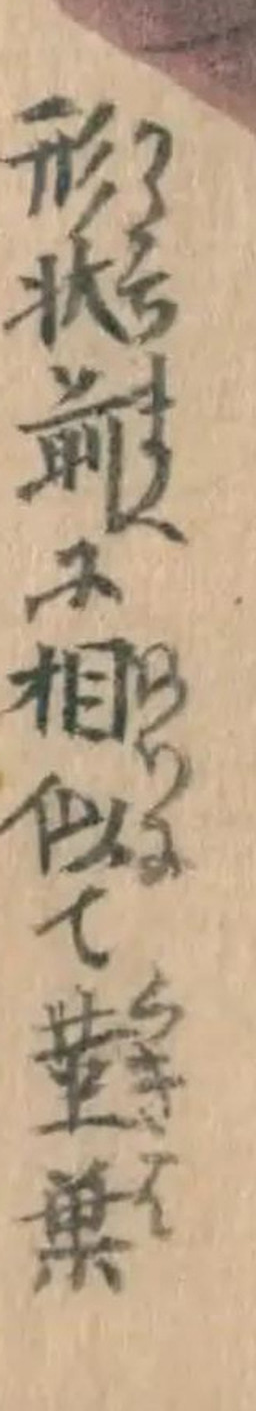形状前に相似て茎葉
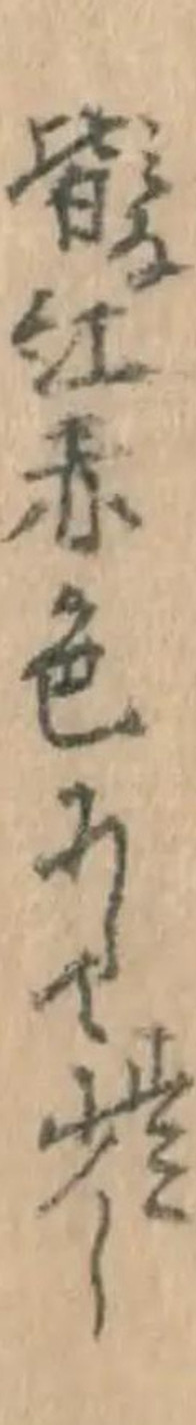皆紅赤色にして少し
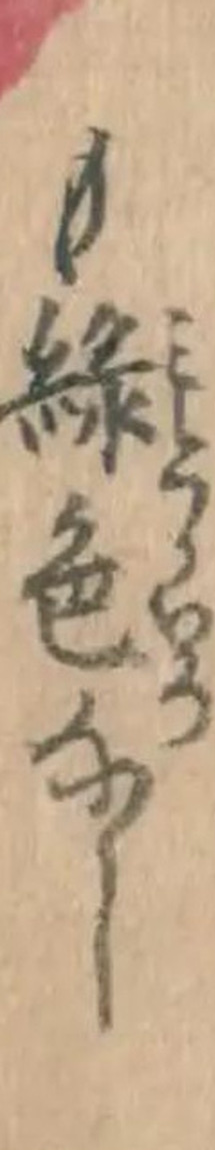も緑色なし

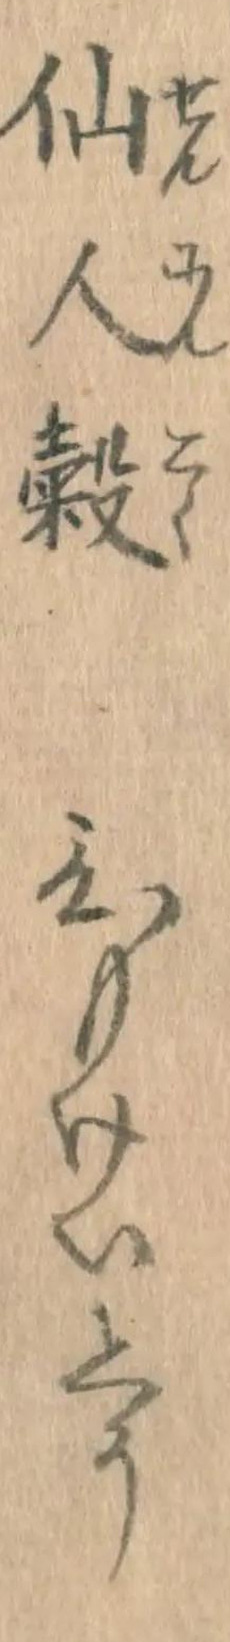仙人穀ひもけいとう
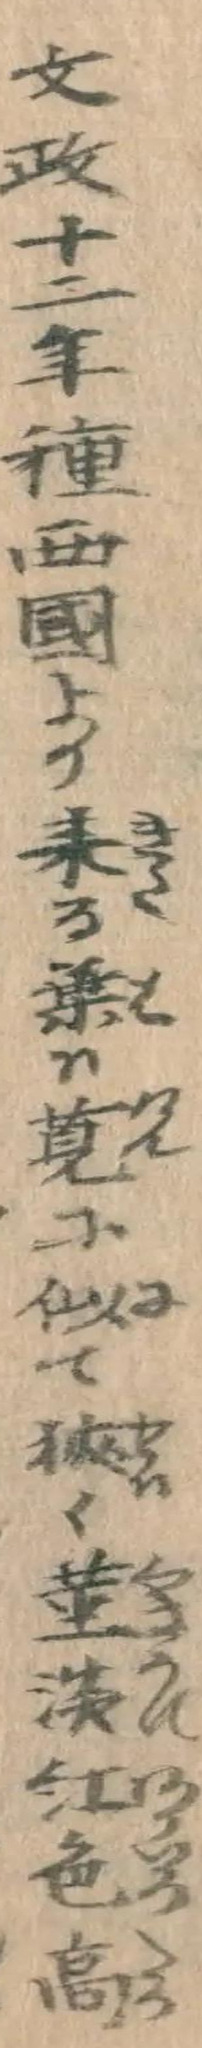文政十二年種西国より来る葉は莧に似て狭く茎淡紅色高
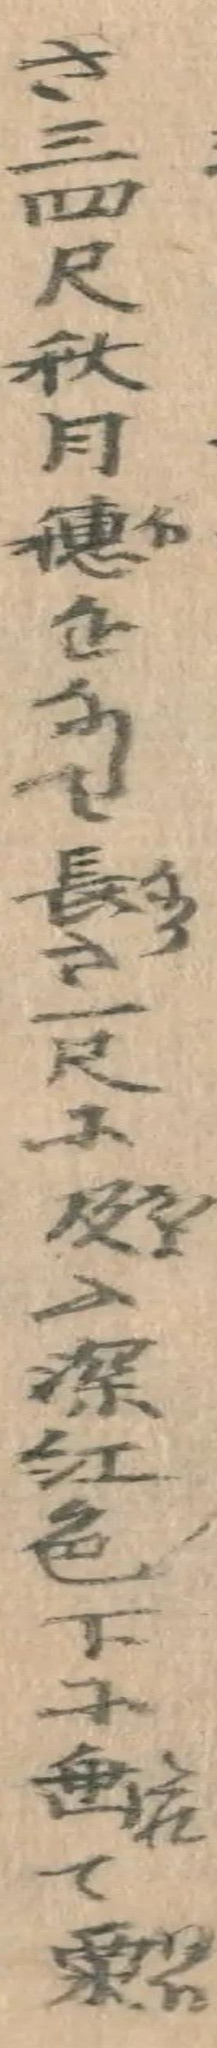さ三四尺秋月穂をなして長さ一尺に及ふ深紅色下に垂て粟
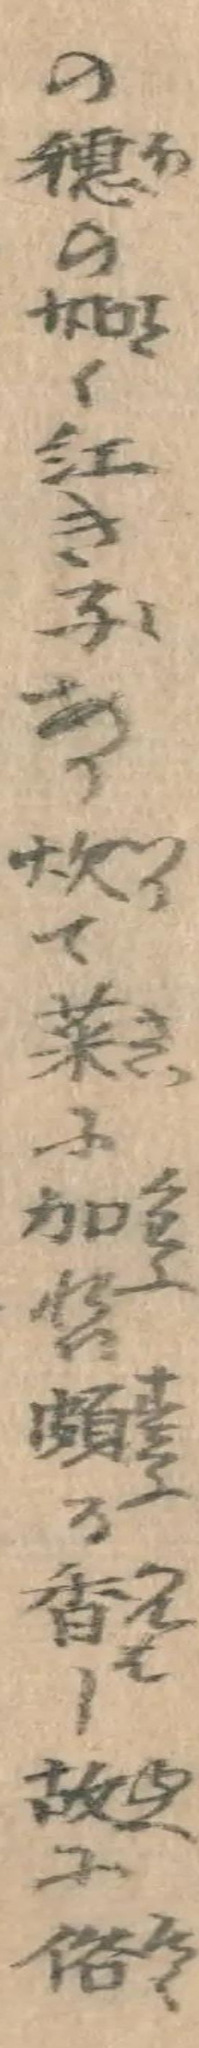の穂の如く紅き子あり炊て菜に加れは頗る香し故に俗
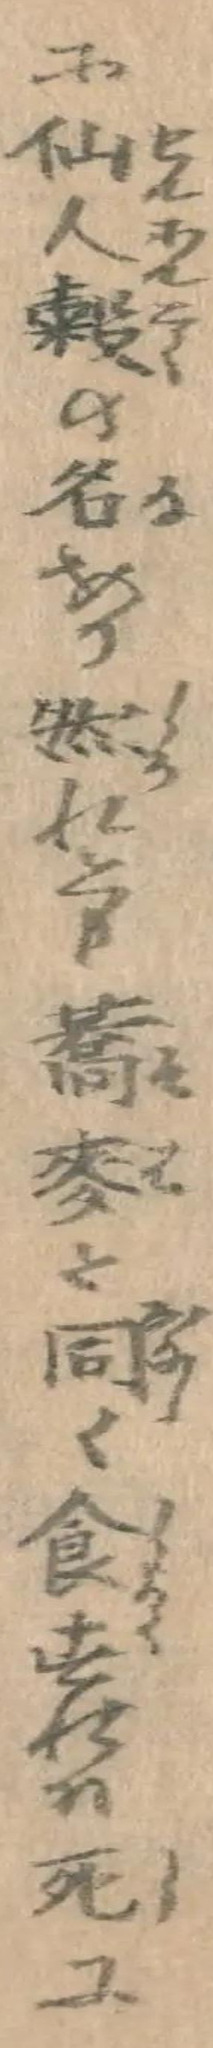に仙人穀の名あり然れとも蕎麦と同く食すれは死に
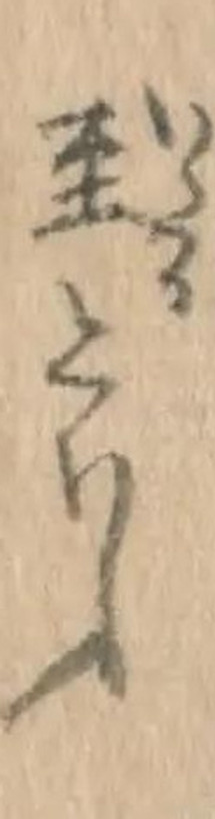至といふ

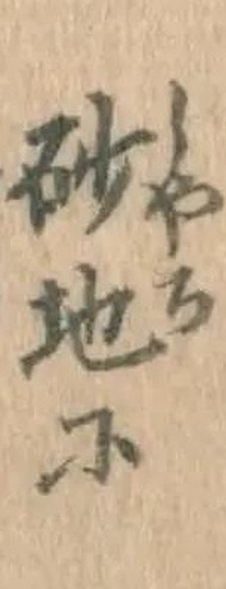砂地に
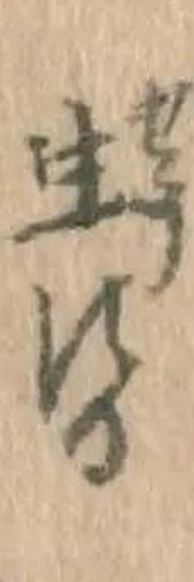生する
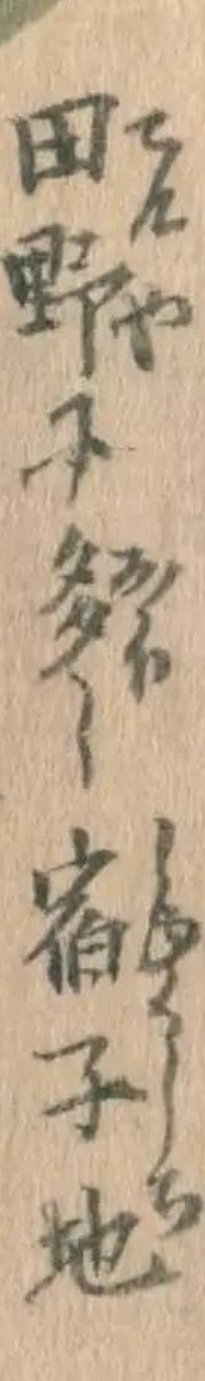田野に多し宿子地
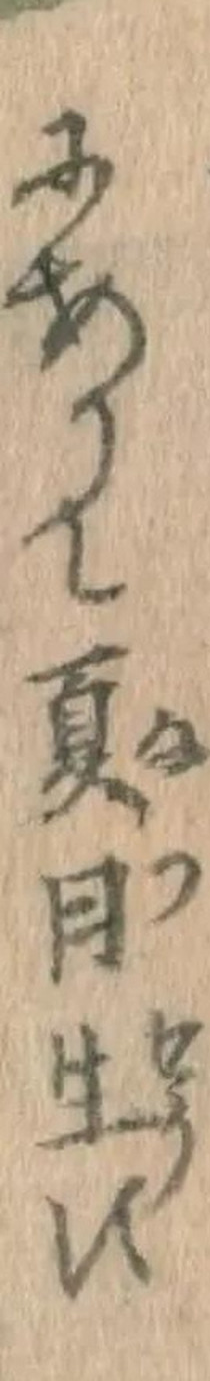にありて夏月生す
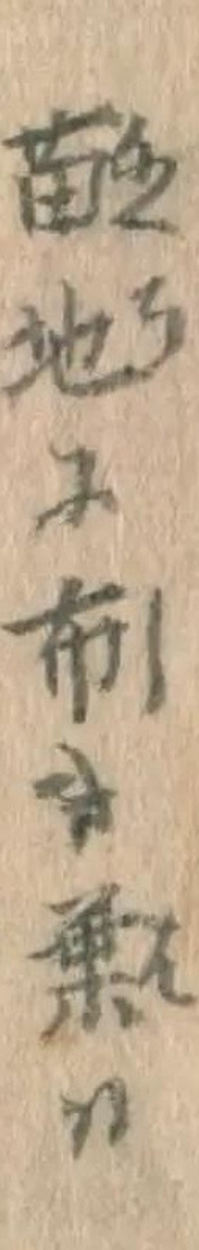苗地に布き葉は
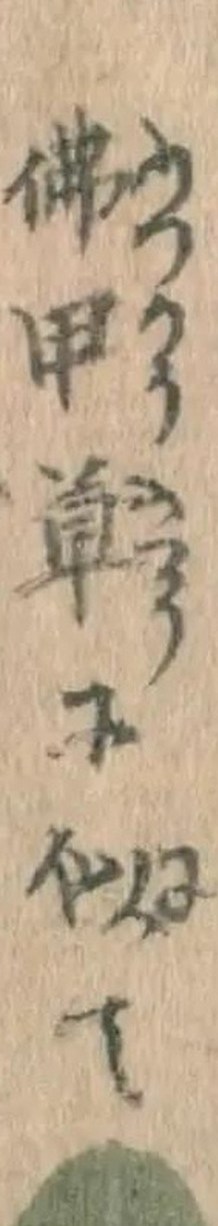仏甲草に似て
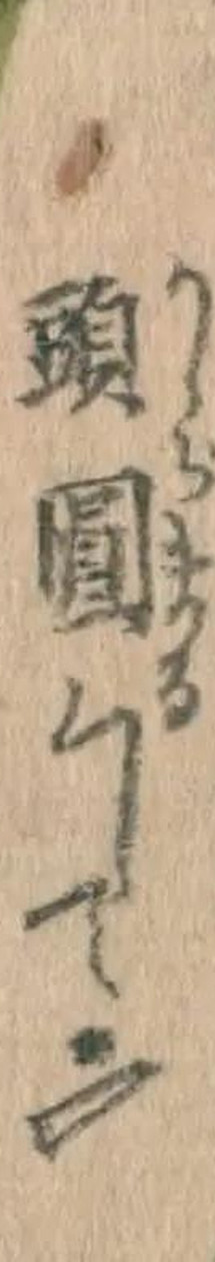頭円くして●○
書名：本草図譜. 巻46-48
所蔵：国立国会図書館 National Diet Library, JAPAN
